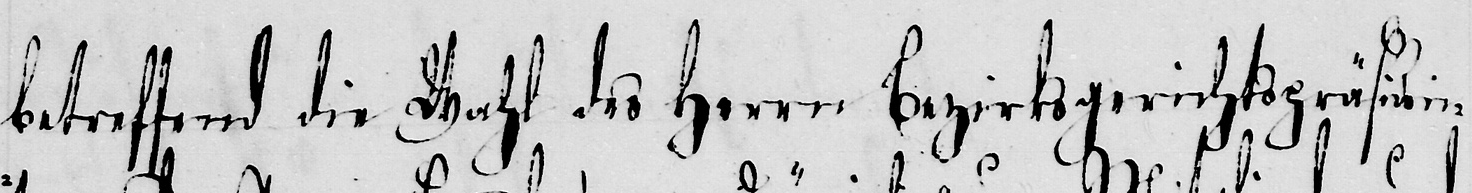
betreffend die Wahl des Herrn Bezirksgerichtspräside¬
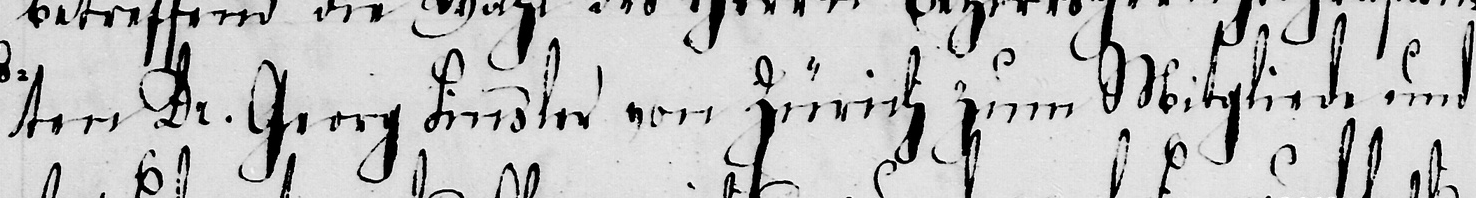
nten Dr. Georg Finsler von Zürich zum Mitgliede und
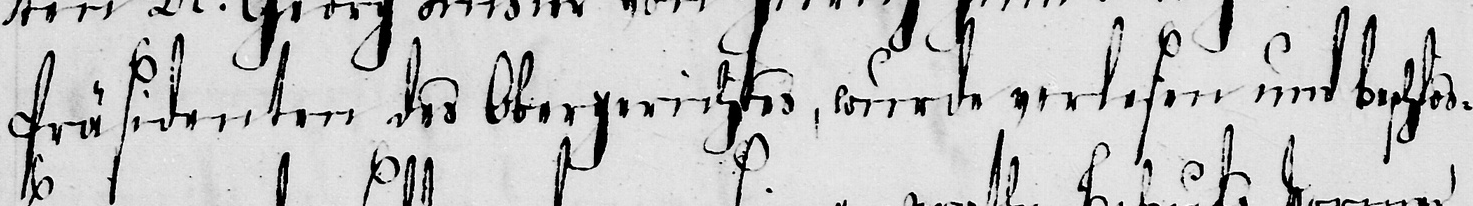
Präsidenten des Obergerichtes, wurde verlesen und beschlo¬
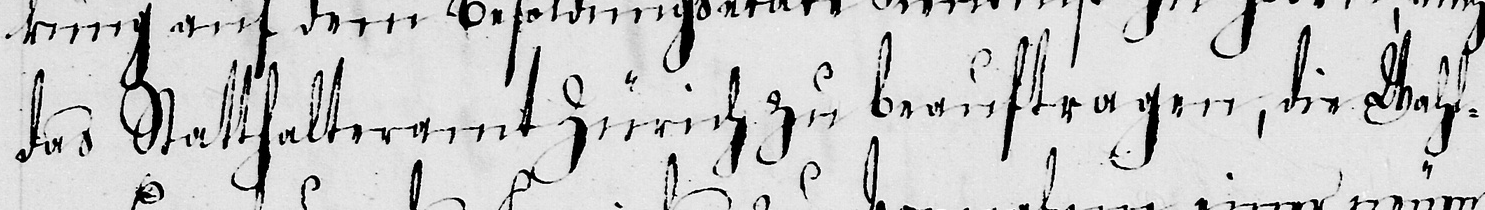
das Statthalteramt Zürich zu beauftragen, die Wahl¬
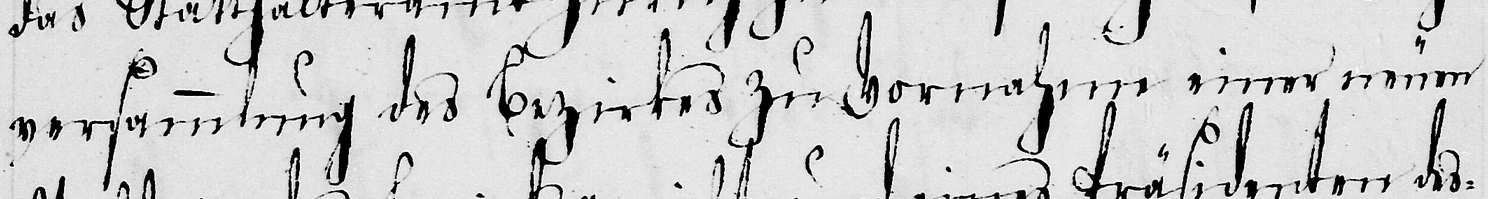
versammlung des Bezirkes zu Vornahme einer neuen
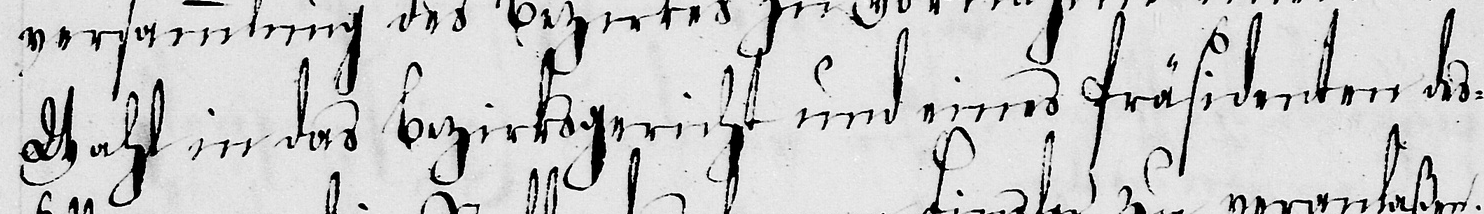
Wahl in das Bezirksgericht und eines Präsidenten des¬
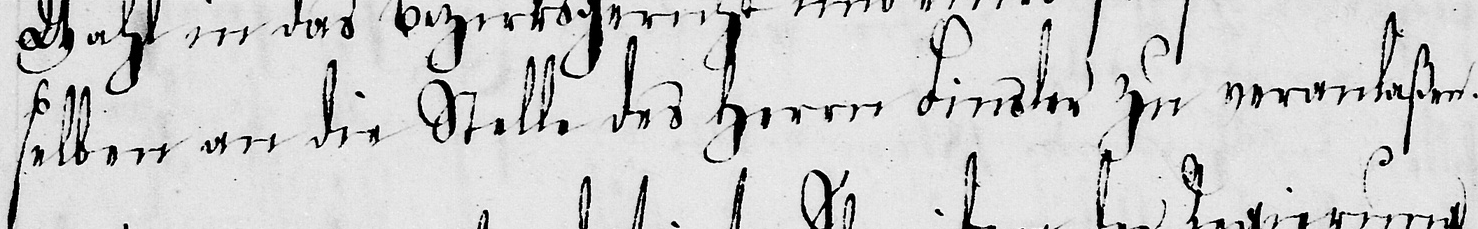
selben an die Stelle des Herrn Finsler zu veranlaßen.
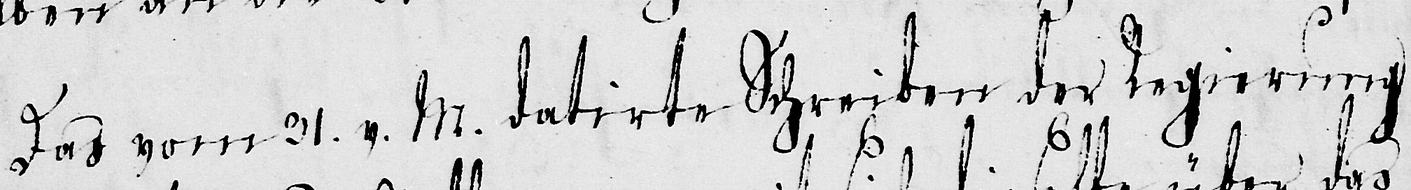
Das vom 31. v. M. datirte Schreiben der Regierung
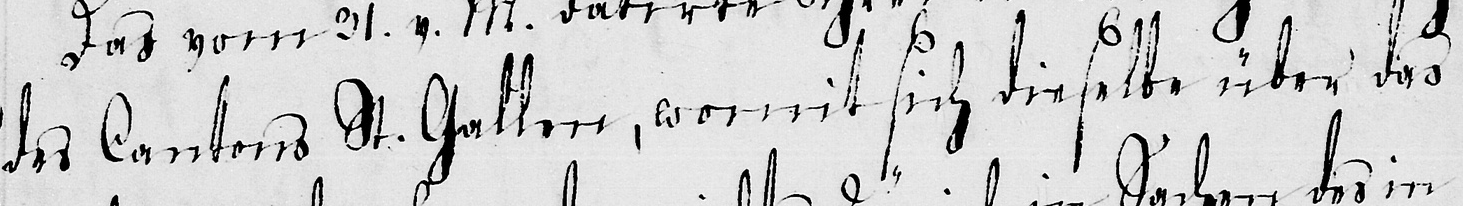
des Cantons St. Gallen, womit sich dieselbe über das
